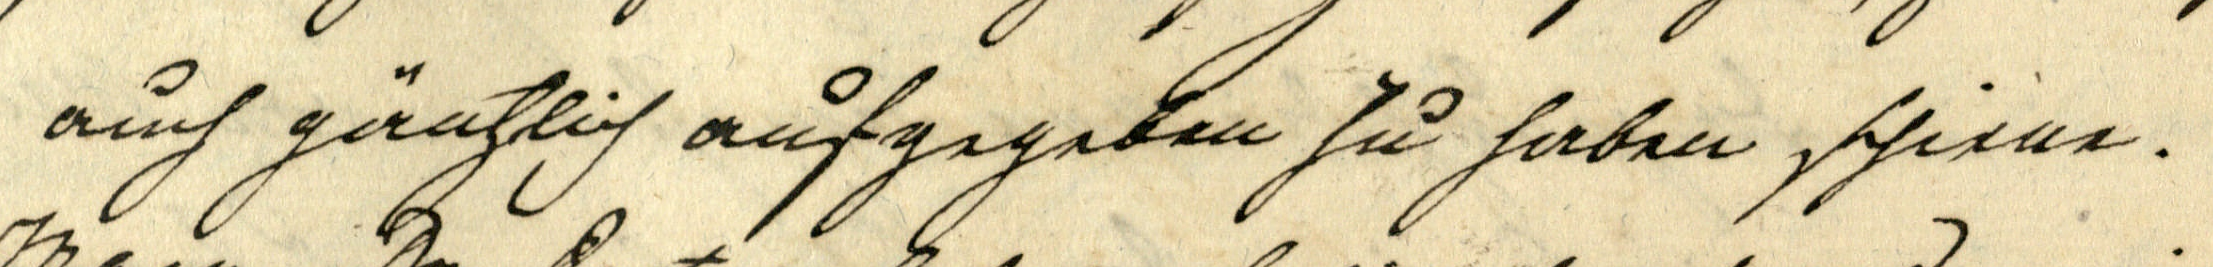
auch gäntzlich aufgegeben zu haben schiene.
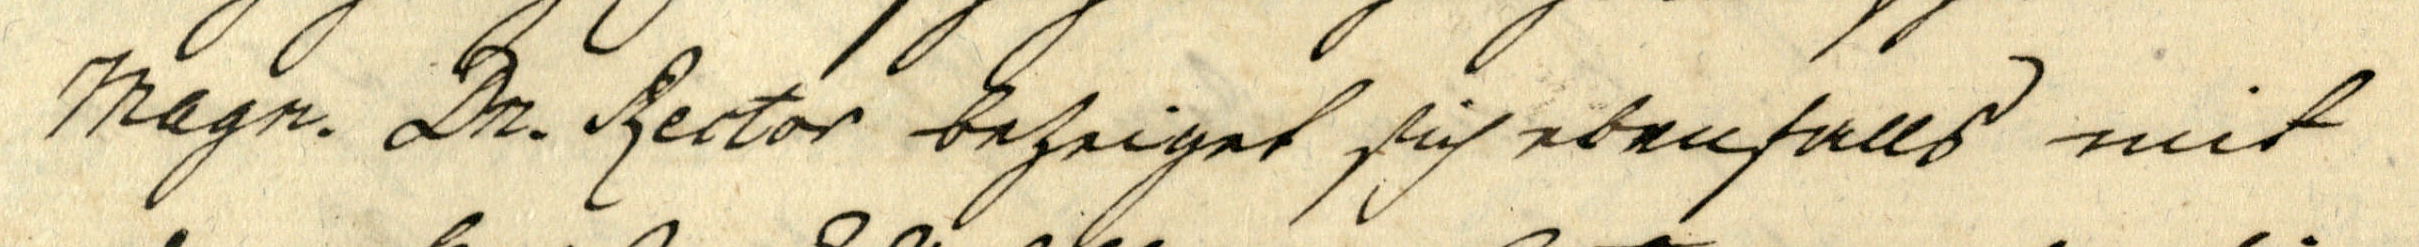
Magn. Dn. Rector bezeiget sich ebenfalls mit
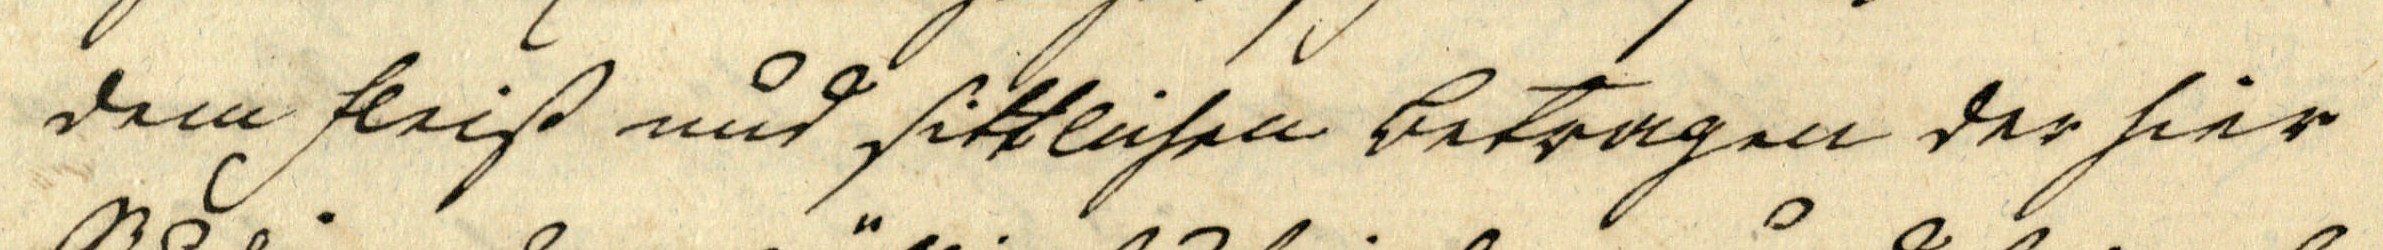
dem Fleiß und sittlichen Betragen der hier
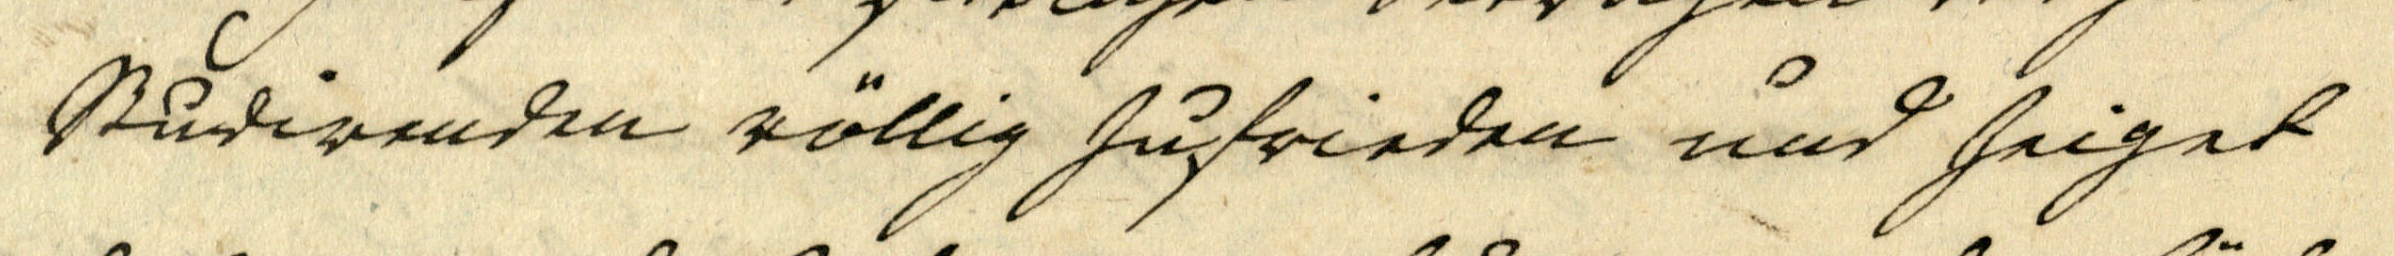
Studirenden völlig zufrieden und zeiget
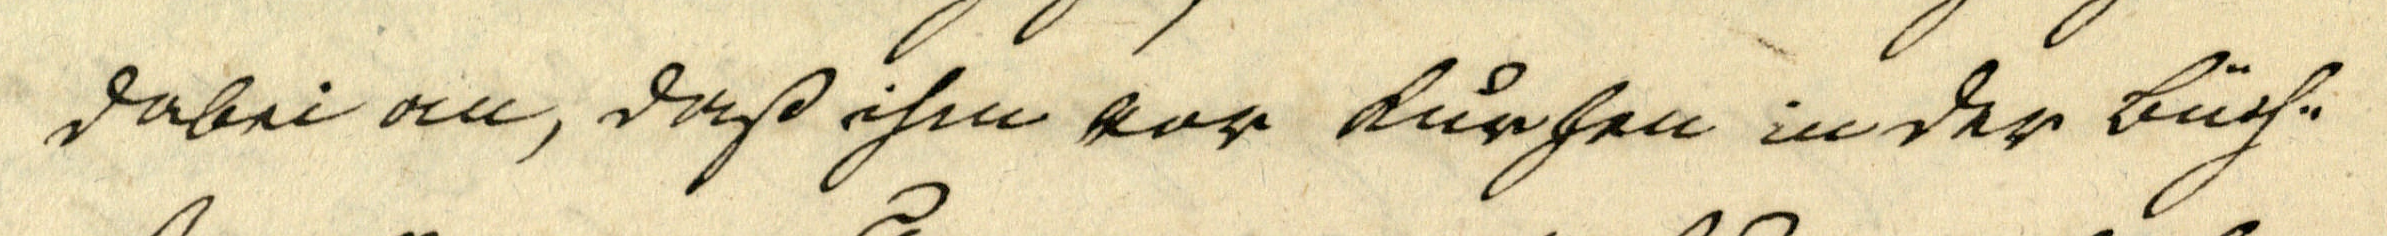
dabei an, daß ihm vor kurzen in der Büch¬
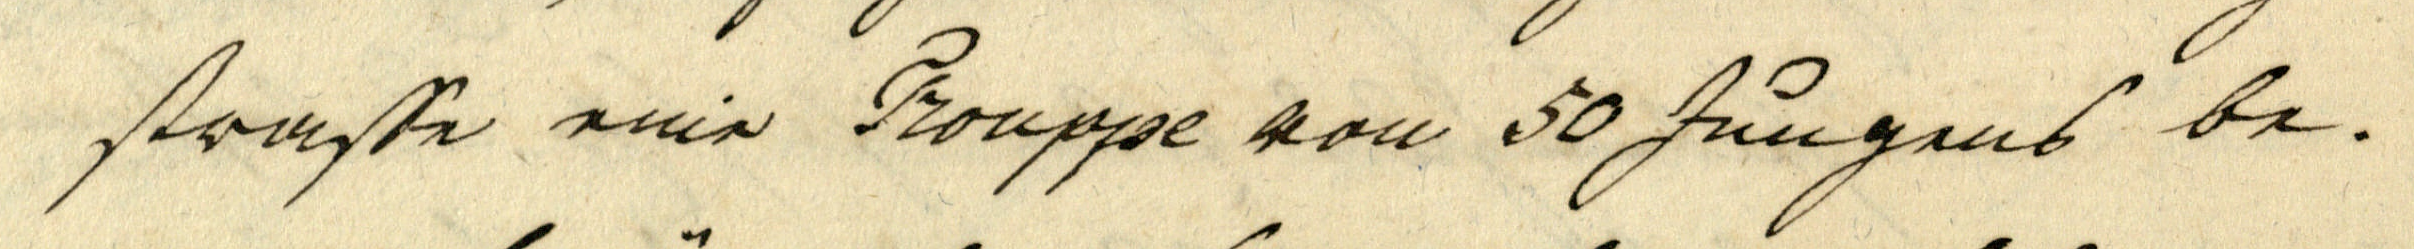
strasse eine Trouppe von 50 Jungens be¬
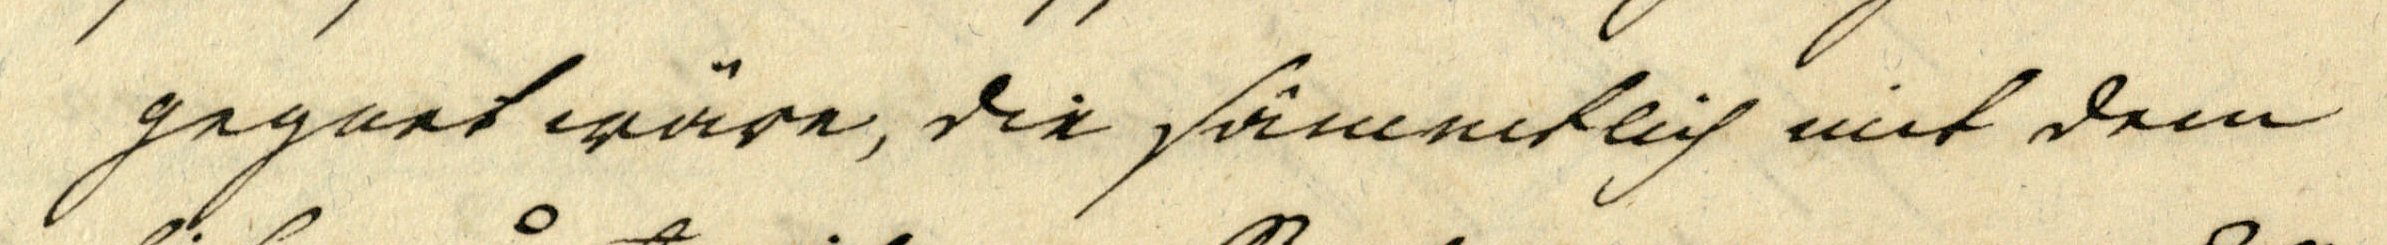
genet wäre, die sämmtlich mit dem
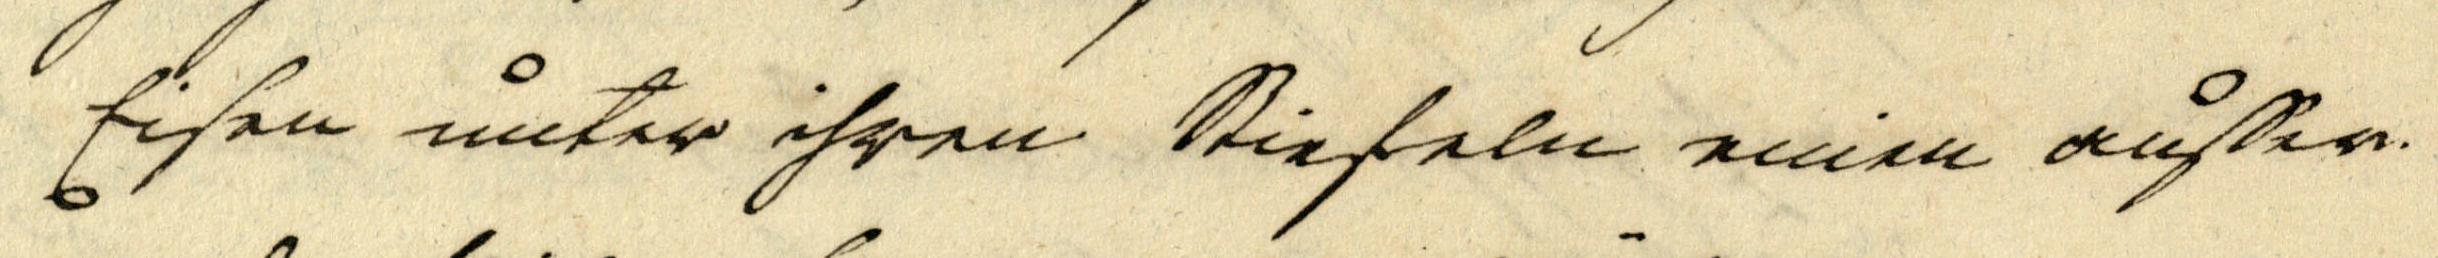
Eisen unter ihren Stiefeln einen ausser¬
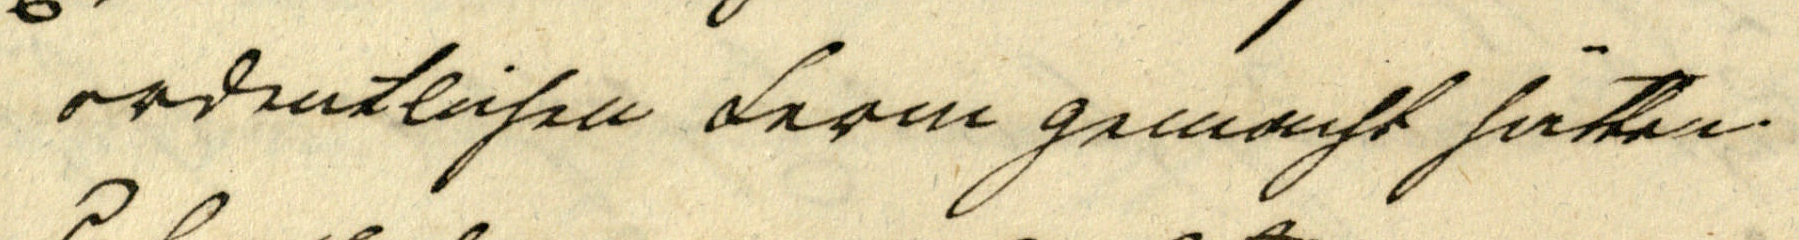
ordentlichen Lerm gemacht hätten.
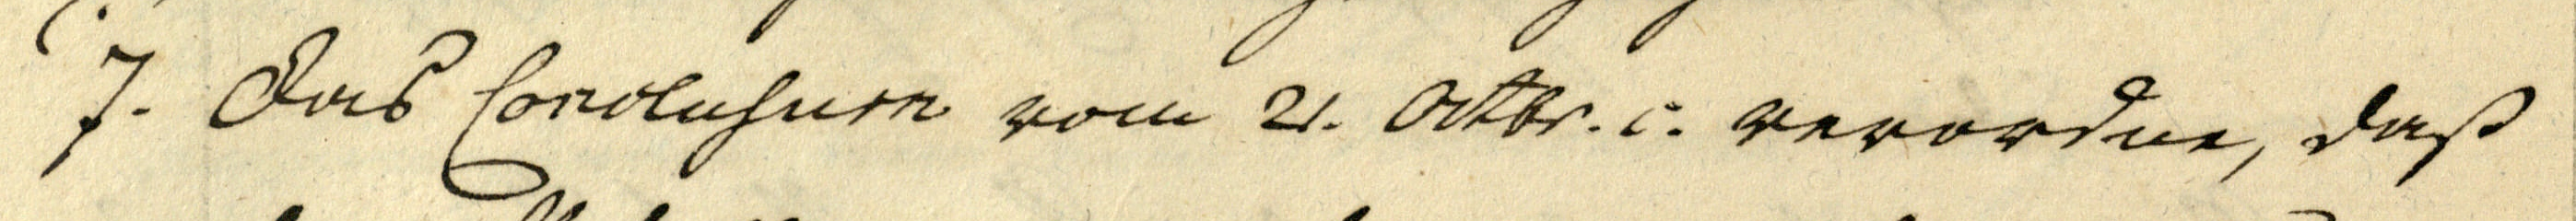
7. Das Conclusum vom 21. Octbr. c. verordne, daß
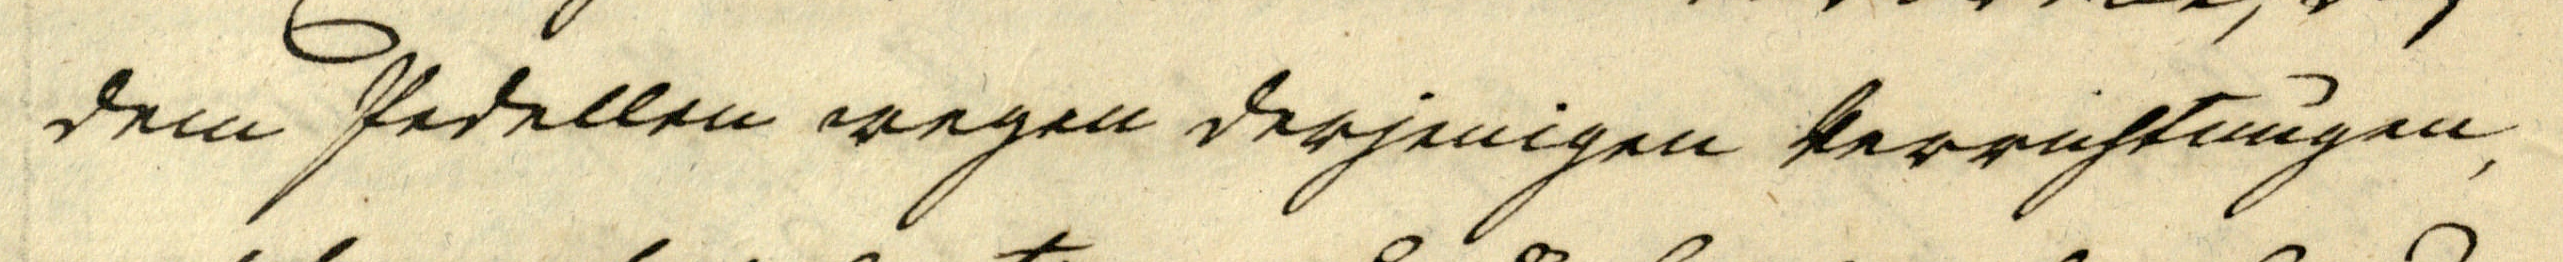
dem Pedellen wegen derjenigen Verrichtungen,
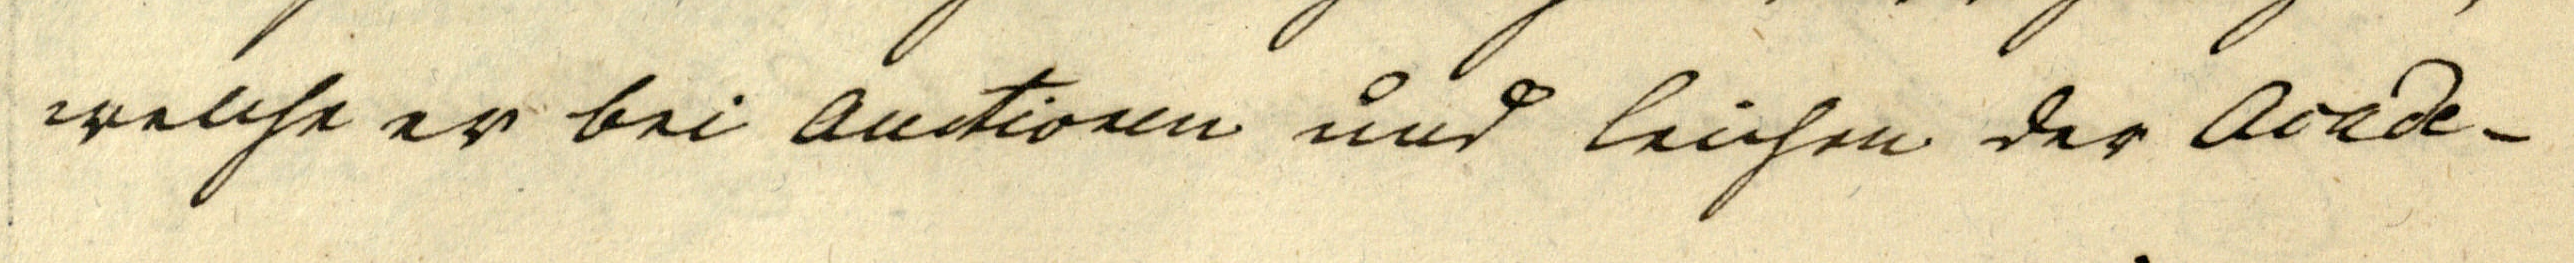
welche er bei Auctionen und leichen der Acade¬
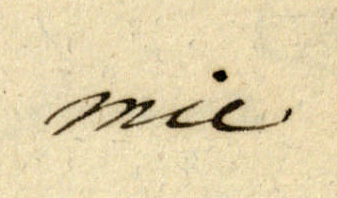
mie
